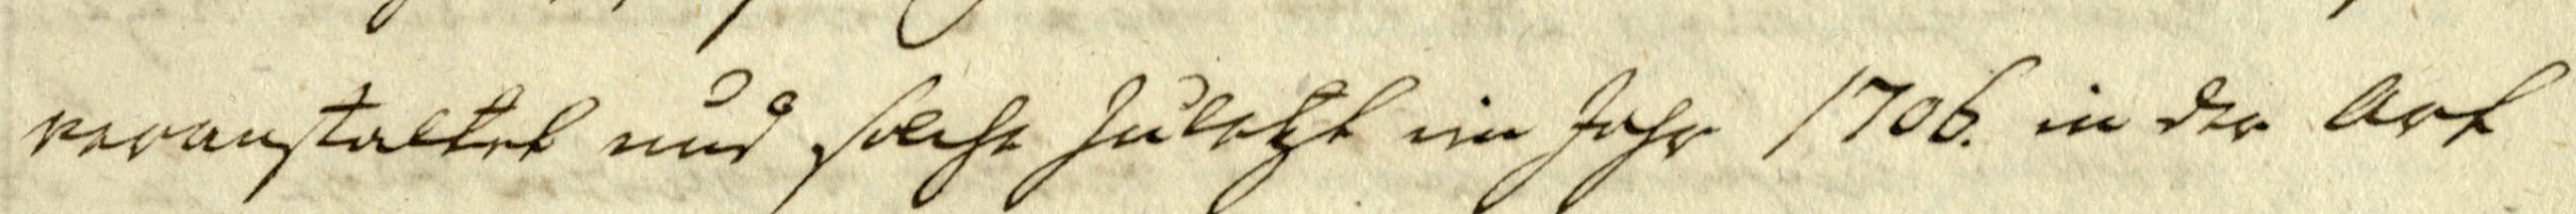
veranstaltet und solche zuletzt im Jahr 1706. in der Art
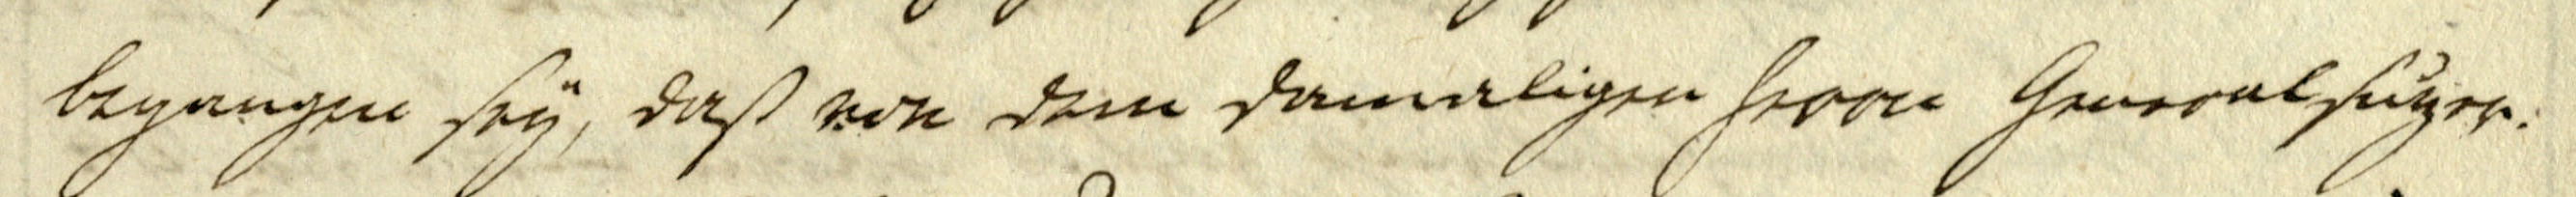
begangen seÿ, daß von dem damaligen herrn Generalsuper¬
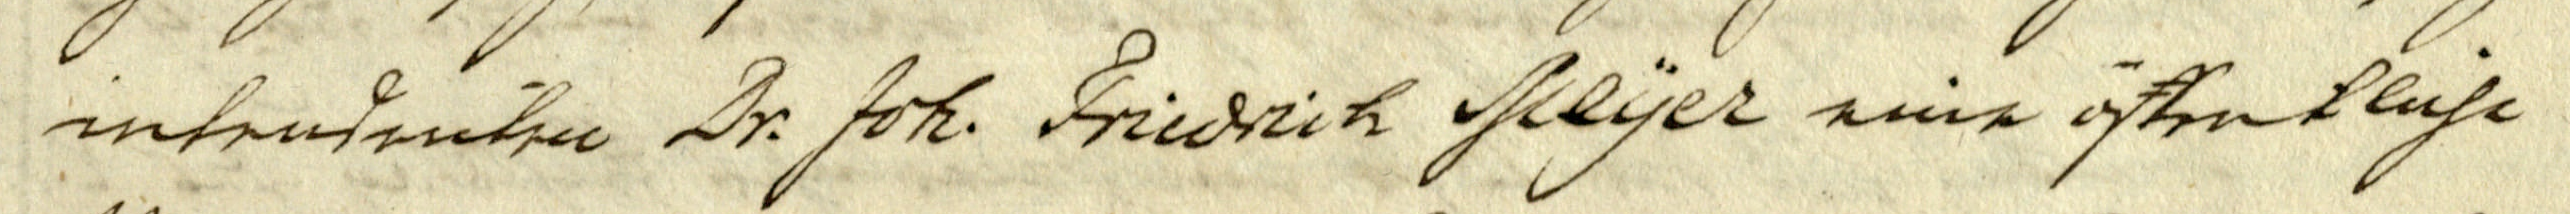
intendenten Dr. Joh. Friedrich Maÿer eine öffentliche
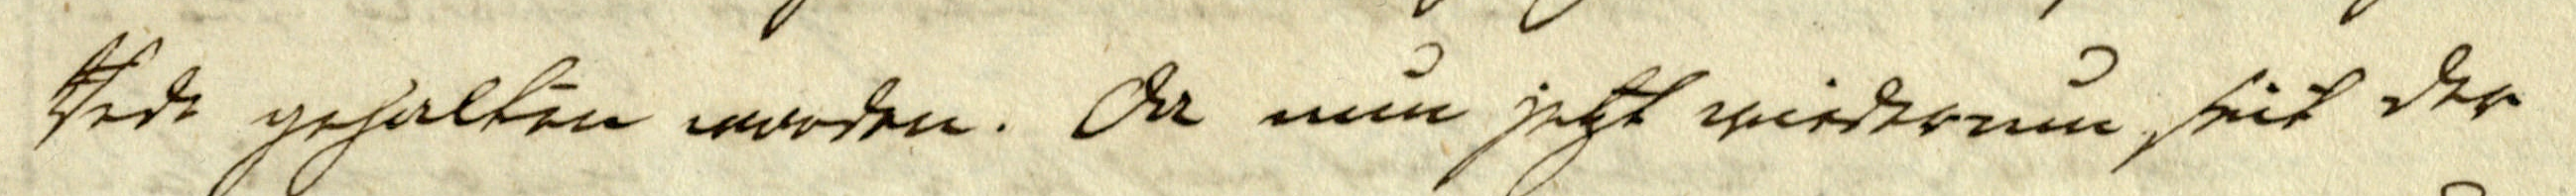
Rede gehalten worden. Da nun jetzt wiederum seit der
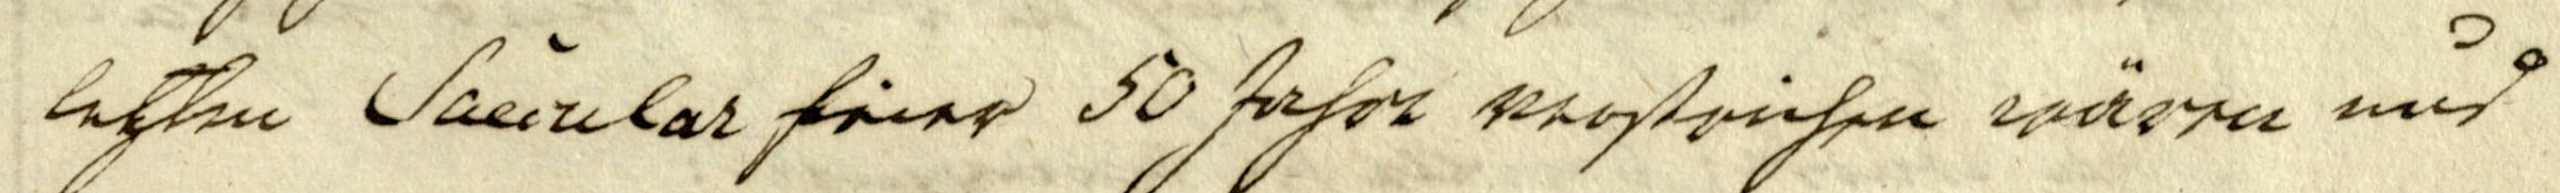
letzten Saecularfeier 50 Jahre verstrichen wären und
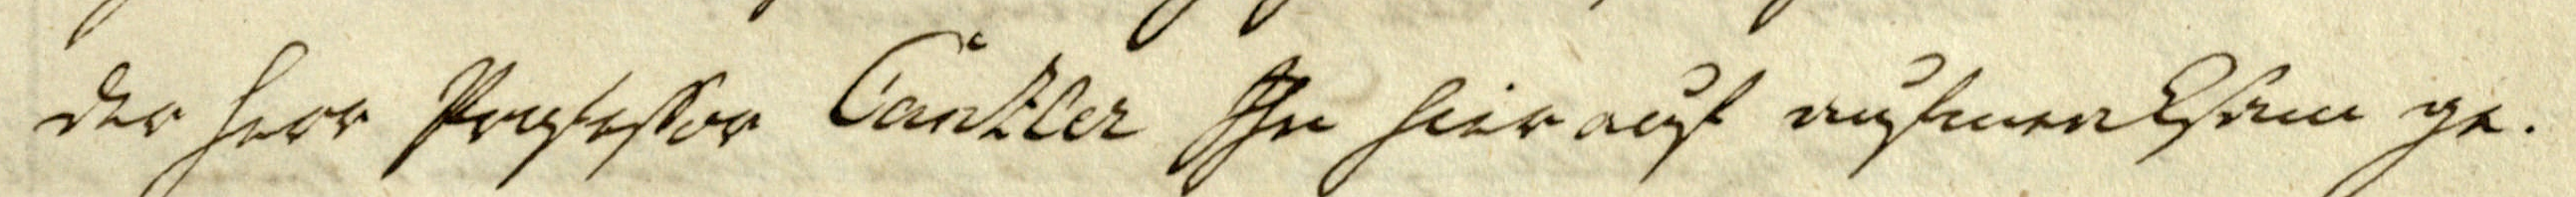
der herr Professor Canzler Ihn hierauf aufmercksam ge¬
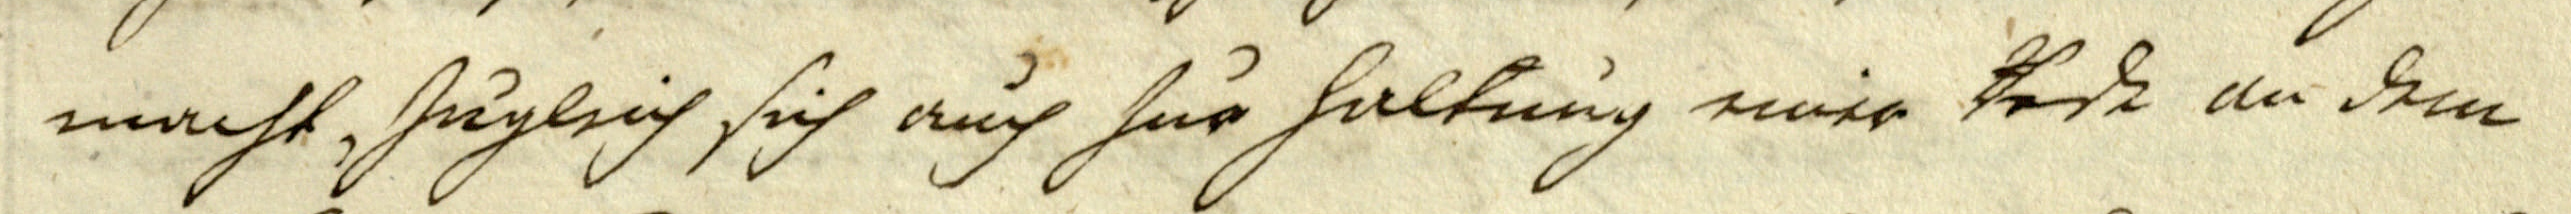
macht, zugleich sich auch zur Haltung einer Rede an dem
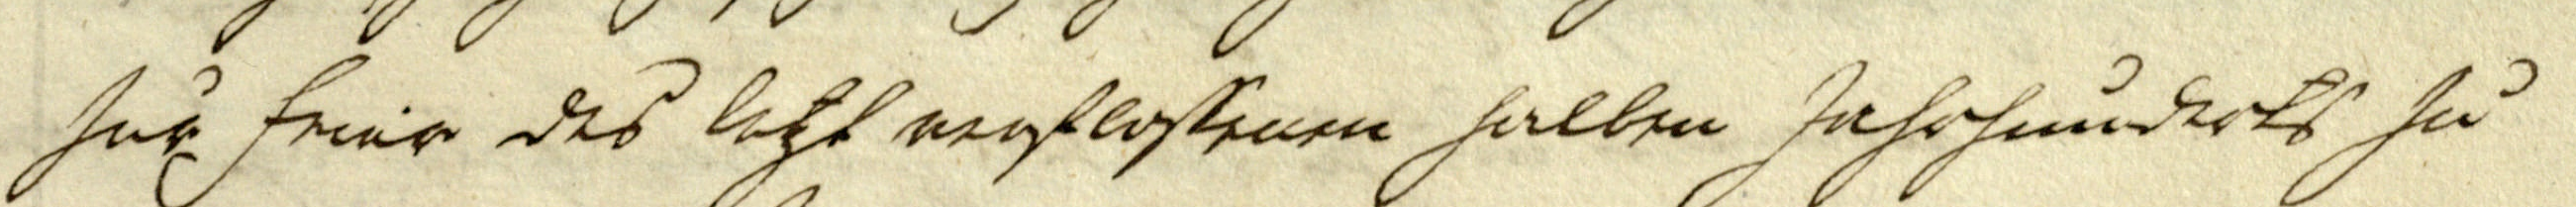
zur Feier des letzt verflossenen halben Jahrhunderts zu
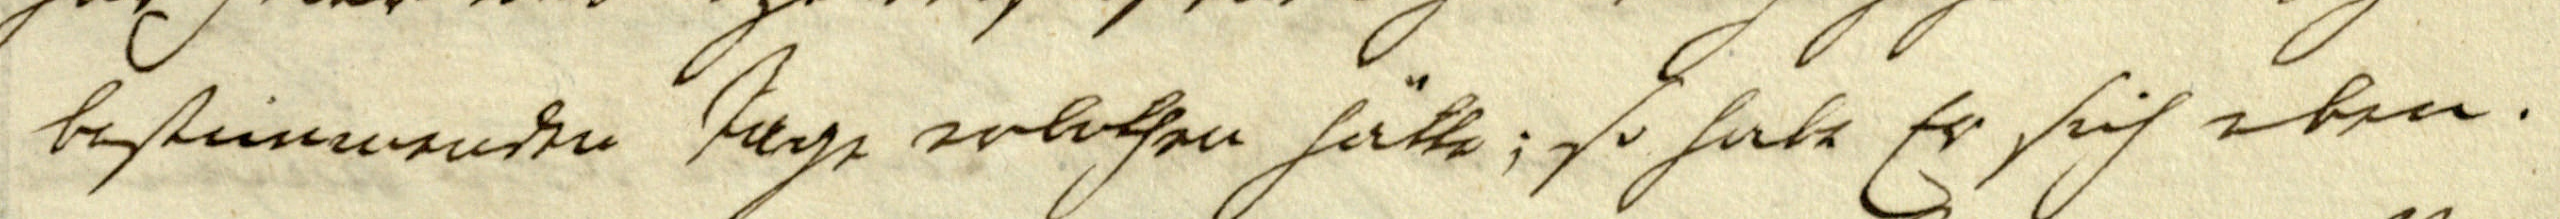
bestimmenden Tage erbothen hätte; so habe Er sich eben¬
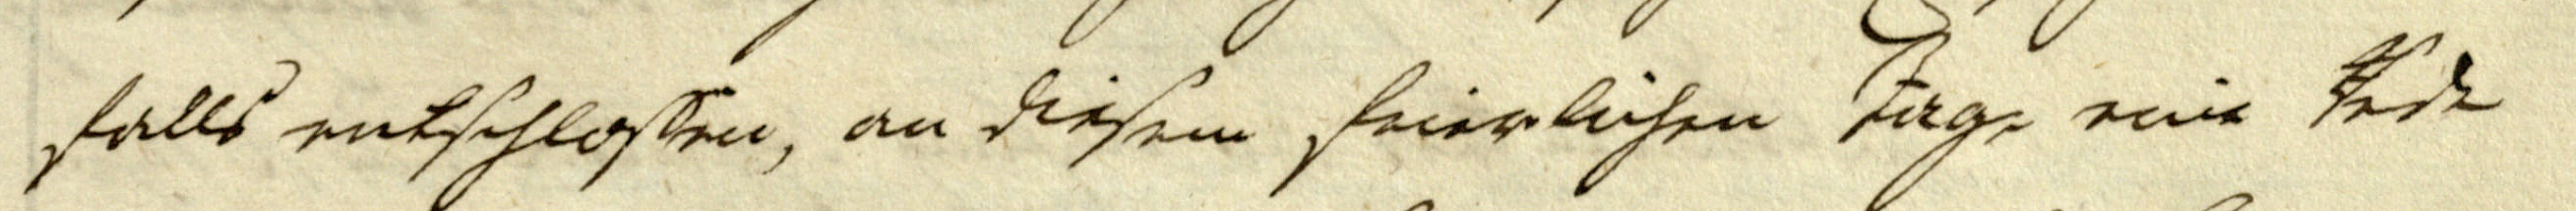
falls entschlossen, an diesem feierlichen Tage eine Rede
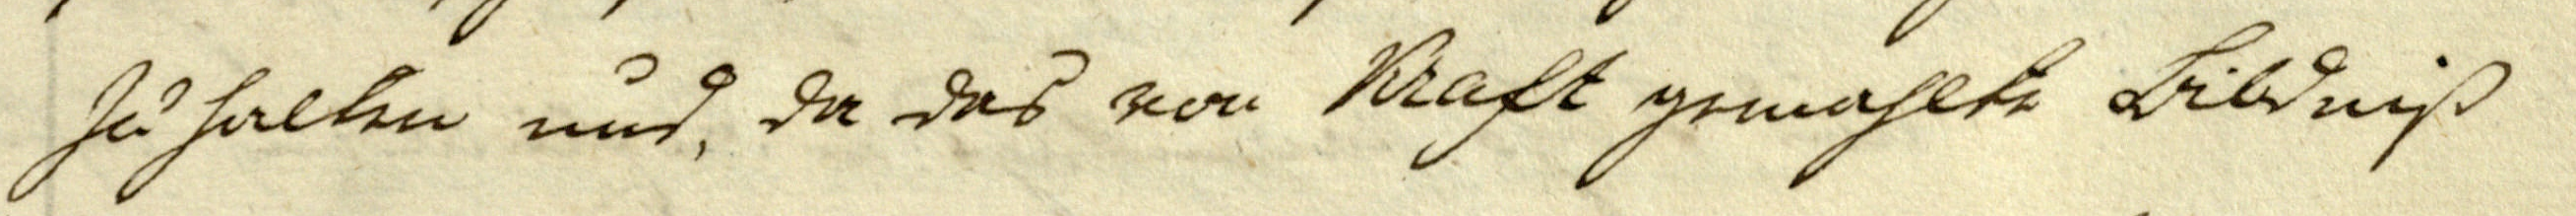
zu halten und, da das von Kraft gemahlte Bildnis
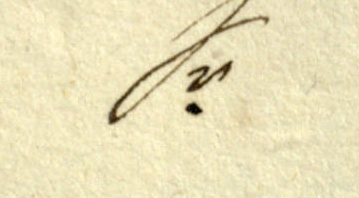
Sr.
